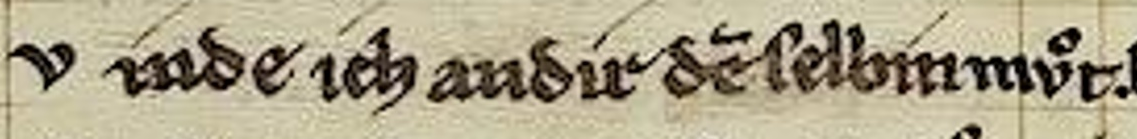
Vinde ich andir de(n) ſelbin mv°ot.
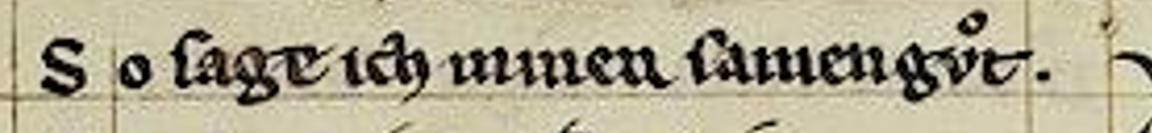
So ſage ich minen ſamen gv°ot.
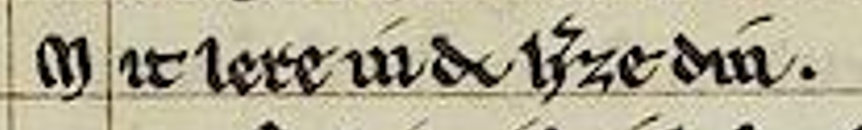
Mit lere in d(az) h(er)ze din.
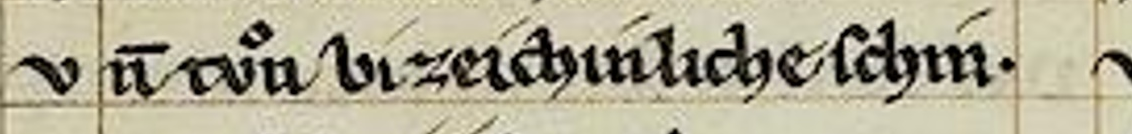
Vn(d) tv°on bi zeichinliche ſchin.
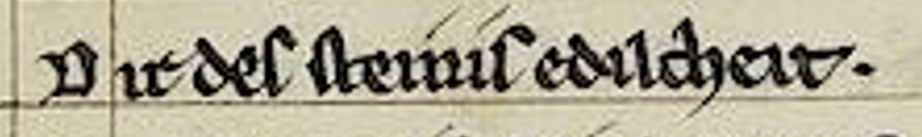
Dir deſ ſteiniſ edilcheit.
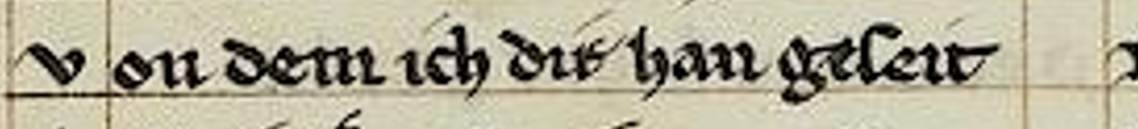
Von dem ich dir han geſeit
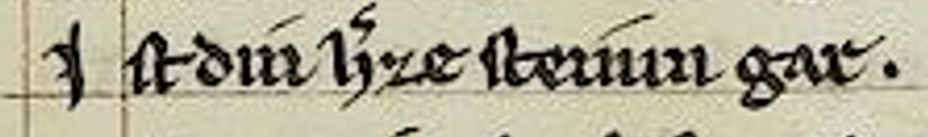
Iſt din h(er)ze ſteinin gar.
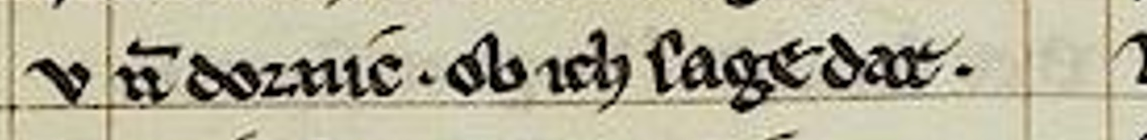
Vn(d) dornic. ob ich ſage dar.
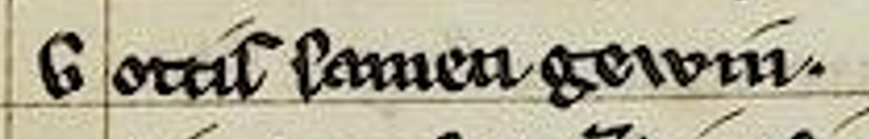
Gottiſ ſamen gewin.
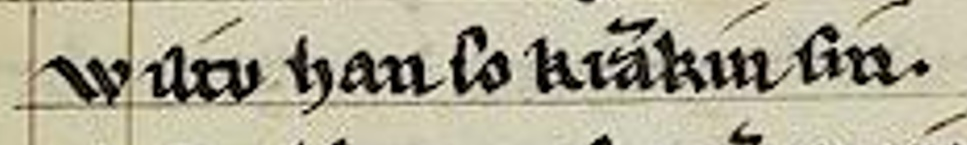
Wiltv han ſo kra(n)kin ſin.
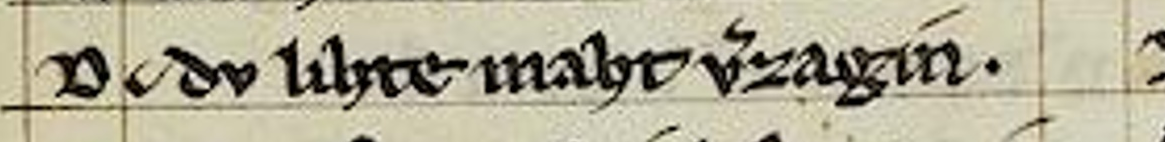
D(az) dv lihte maht v(er)zagin.
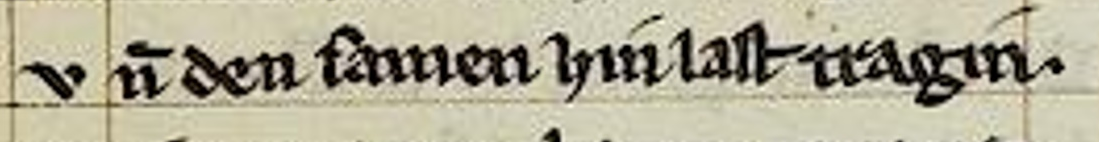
Vn(d) den ſamen hin laſt tragin.
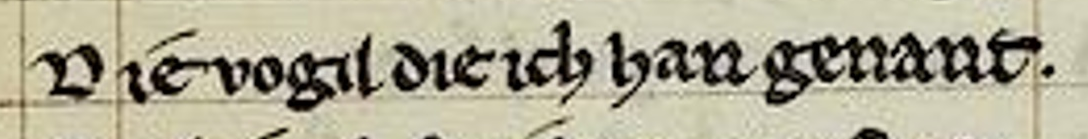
Die vogil die ich han genant.
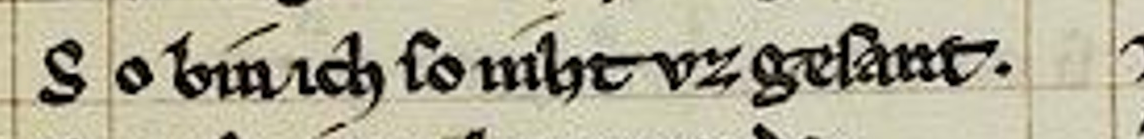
So bin ich ſo niht vz geſant.
